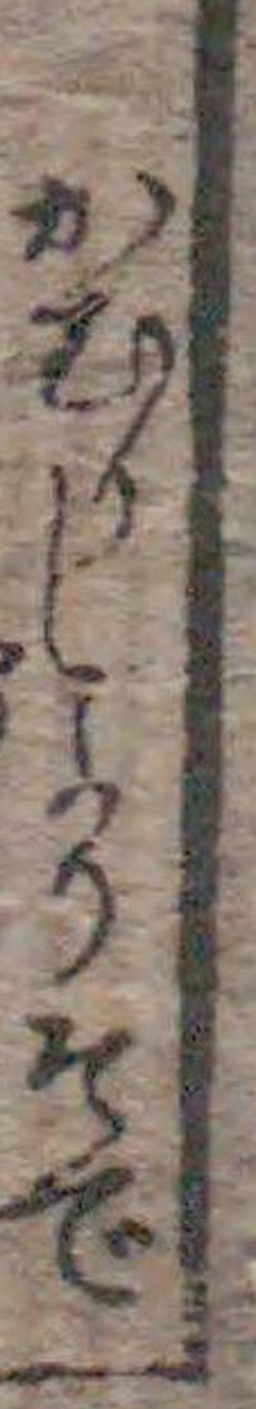かむりしよりそで
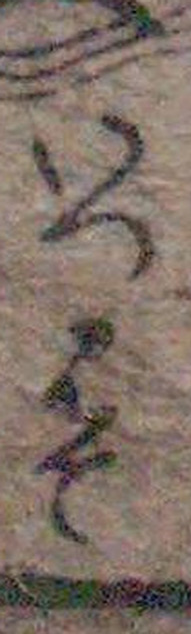いつ見て

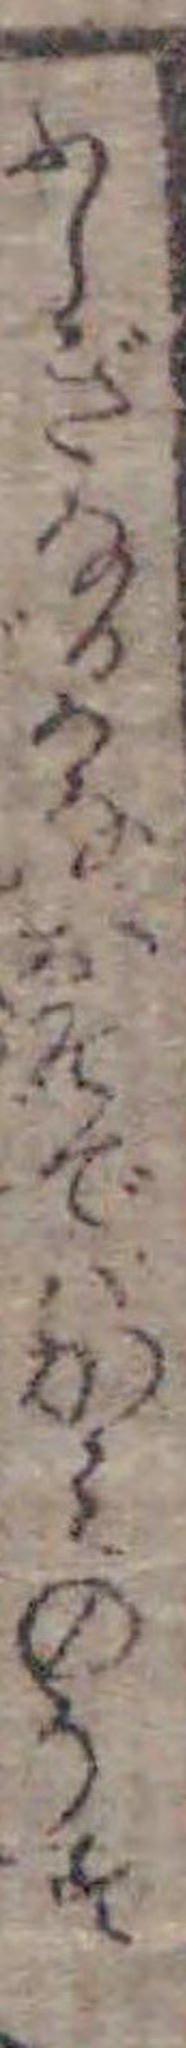ふしぎなるかなおそではかみのうす
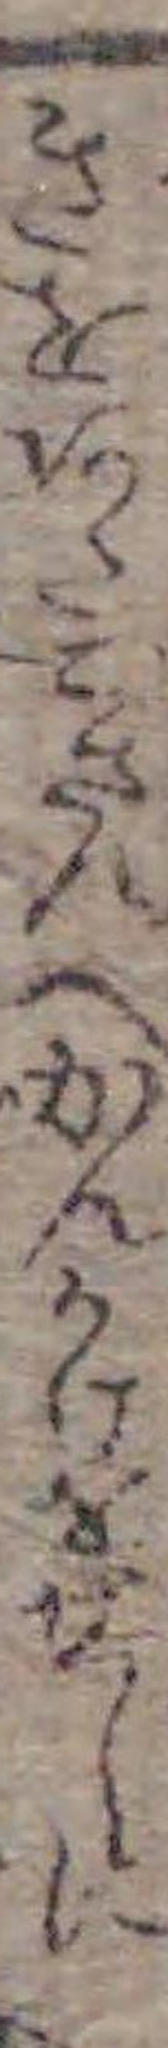きをあたごさんへがんかけをせしに
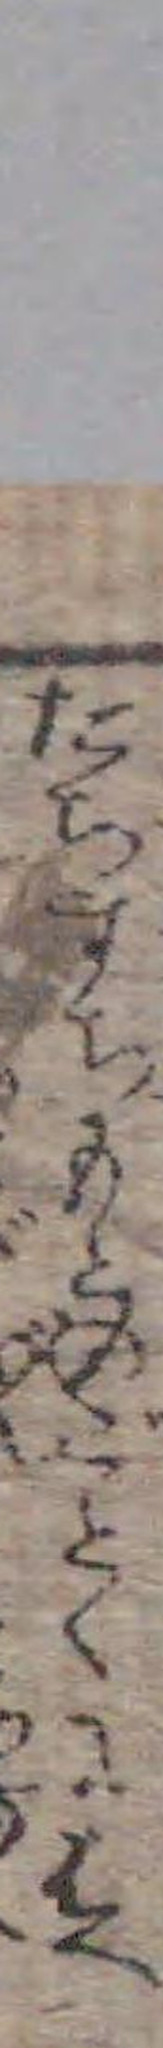たちまちもとのごとくにはへ
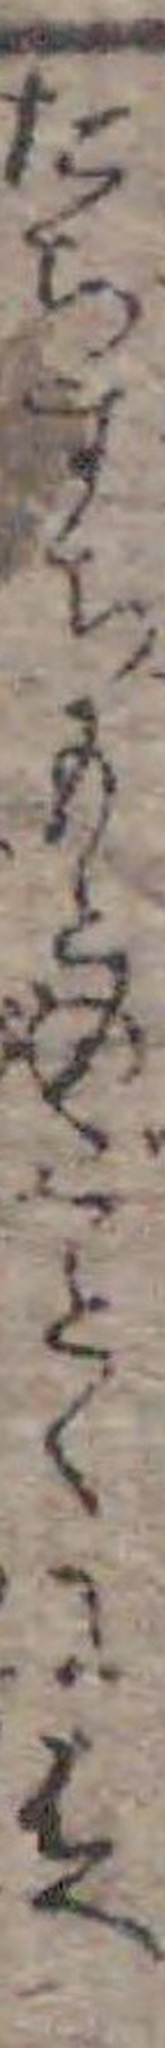たちまちもとのごとくにはへ
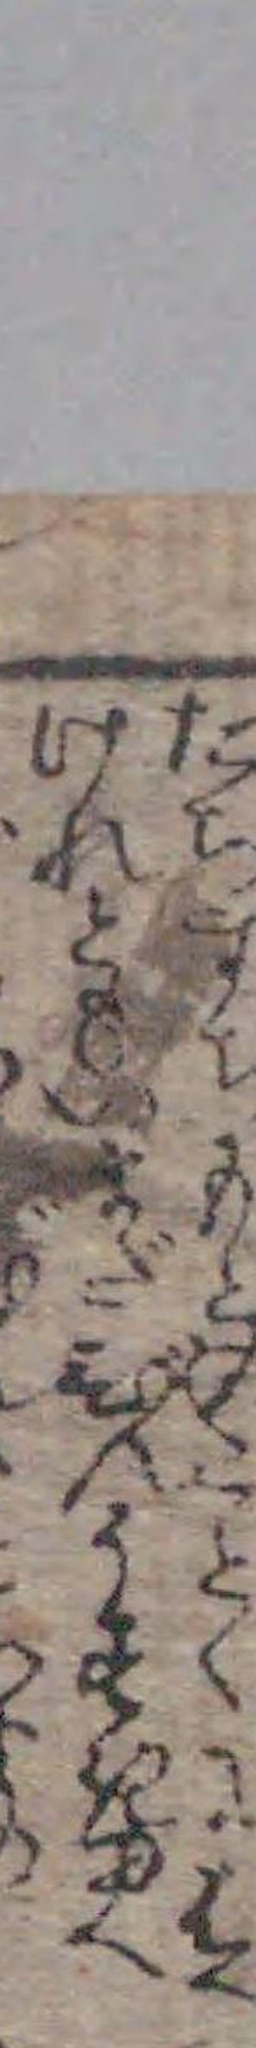けれともいまだびんうすきゆへ
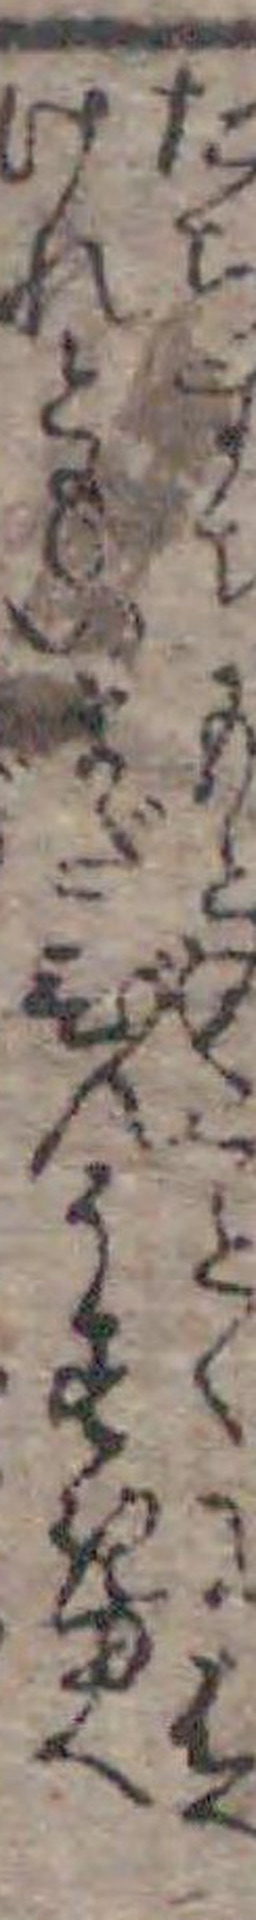けれともいまだびんうすきゆへ
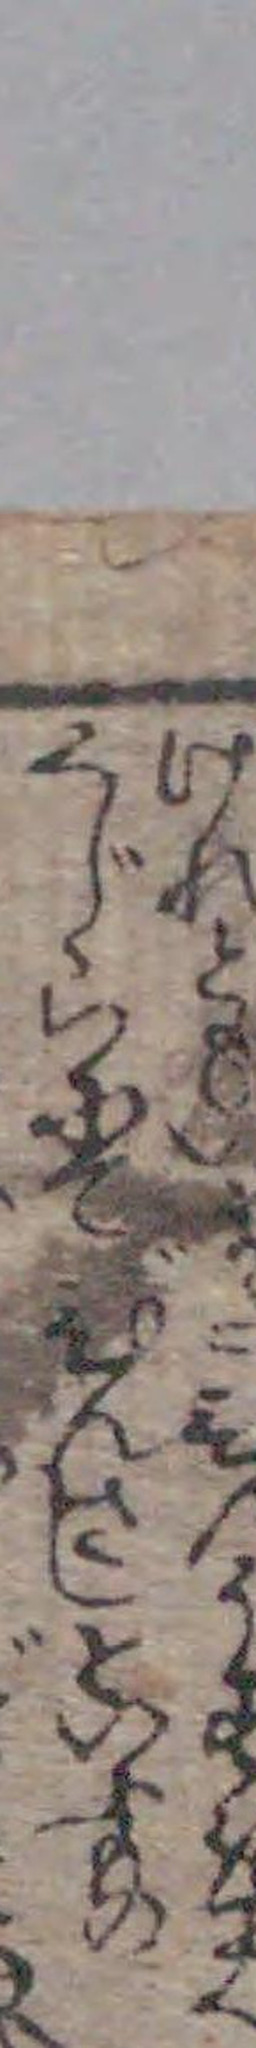くじらにてびんさしといふもの
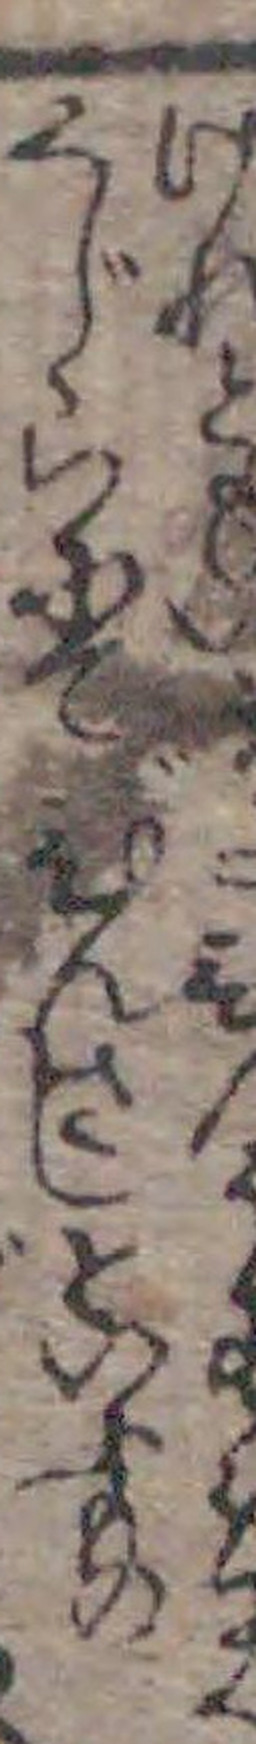くじらにてびんさしといふもの
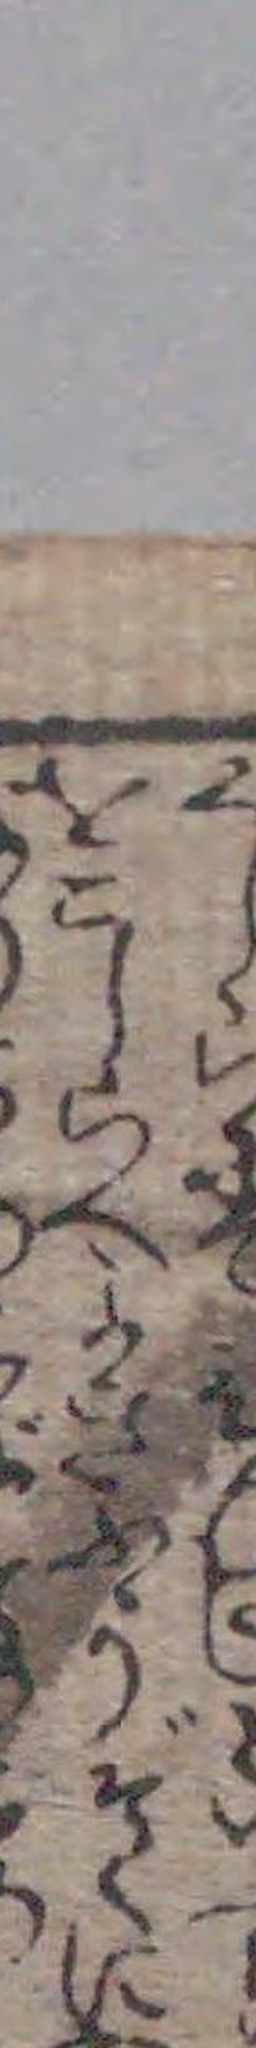をこしらへよきふうぞくに
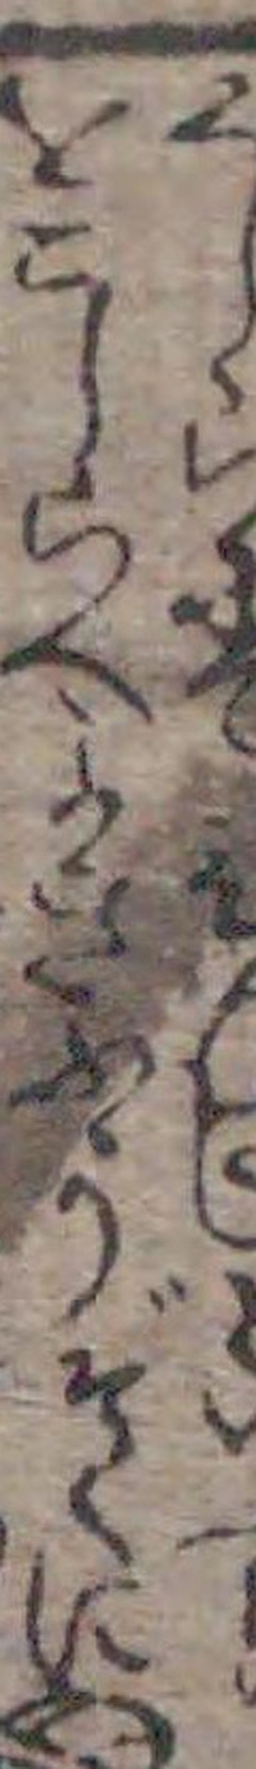をこしらへよきふうぞくに
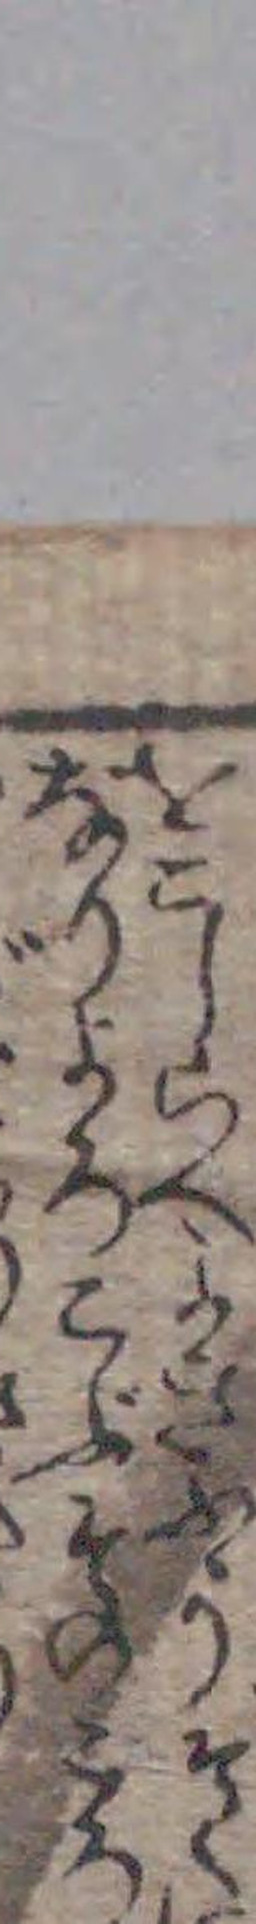なりよろこぶそのころ
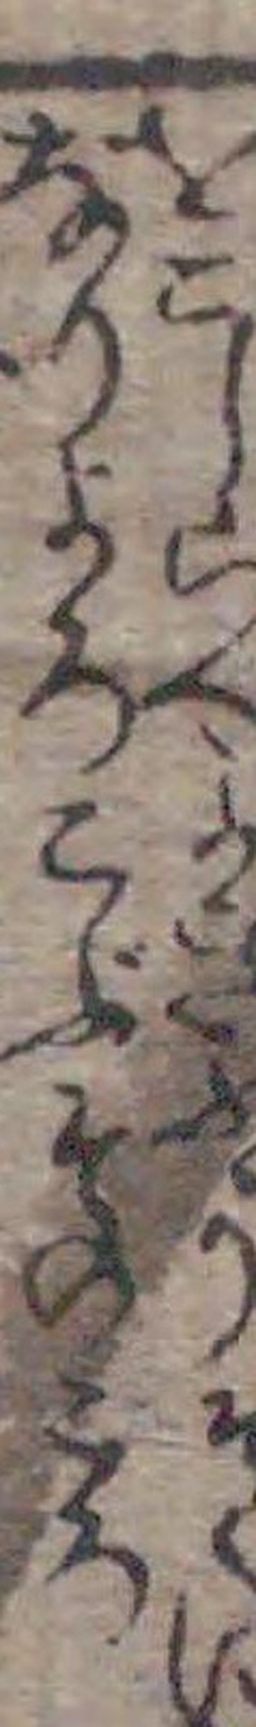なりよろこぶそのころ
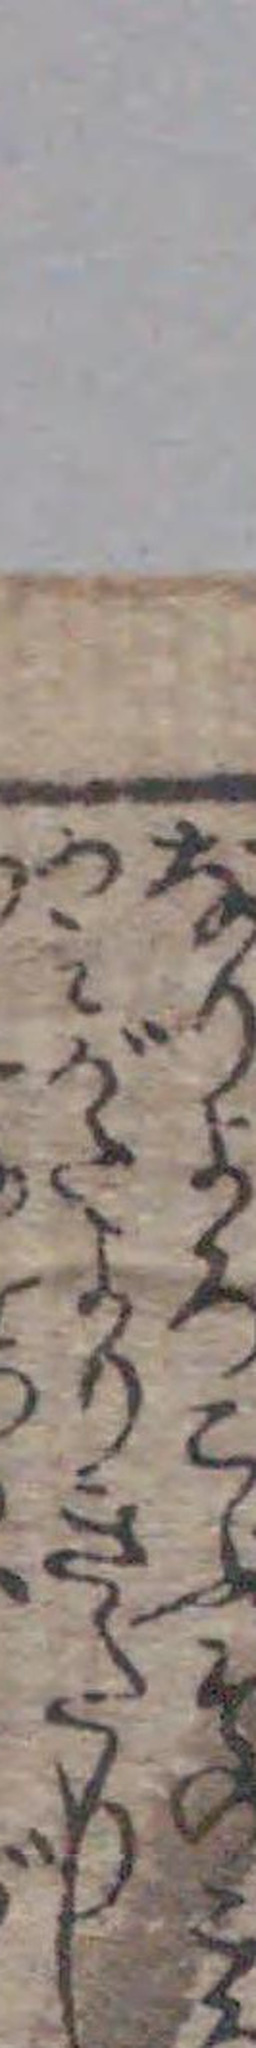かみがたよりきたりし
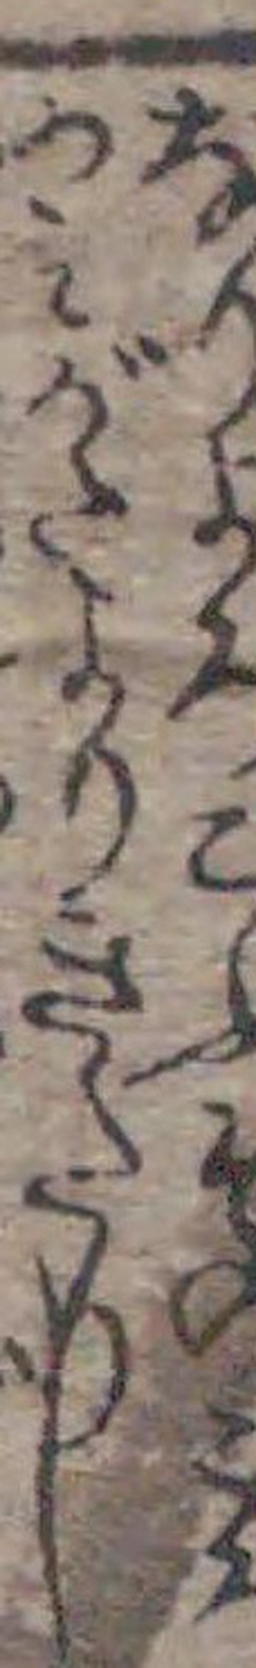かみがたよりきたりし
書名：神田与吉一代記 : 3巻
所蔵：国立国会図書館 National Diet Library, JAPAN
